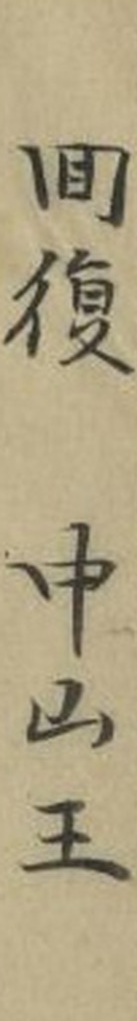回復中山王
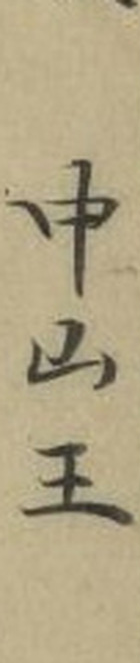中山王
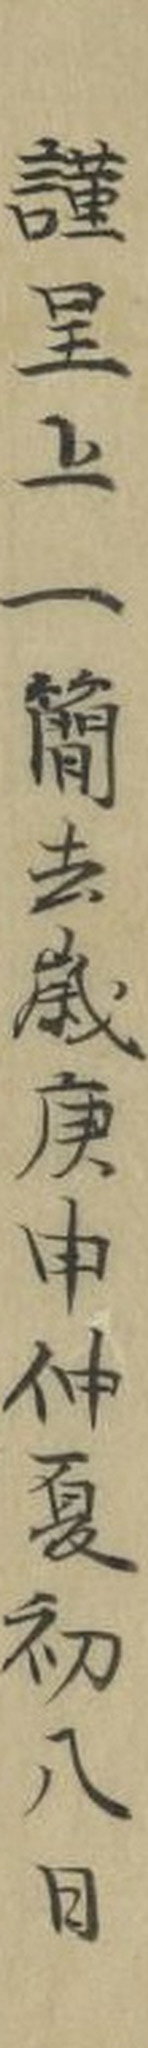謹呈上一簡去歳庚申仲夏初八日
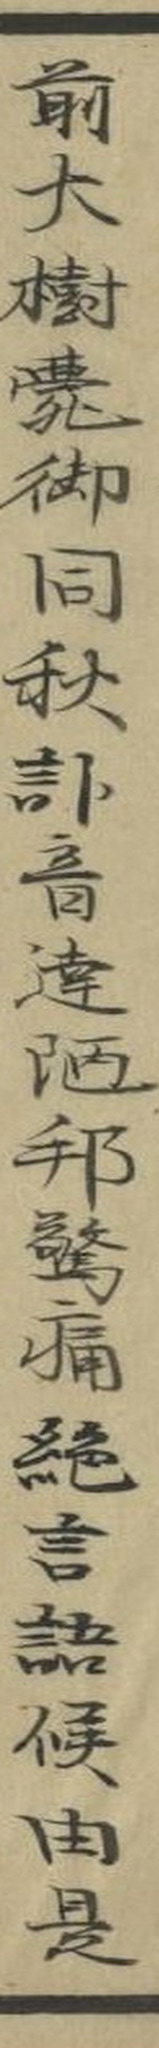前大樹薨御同秋訃音達陋邦驚痛絶言語候由是
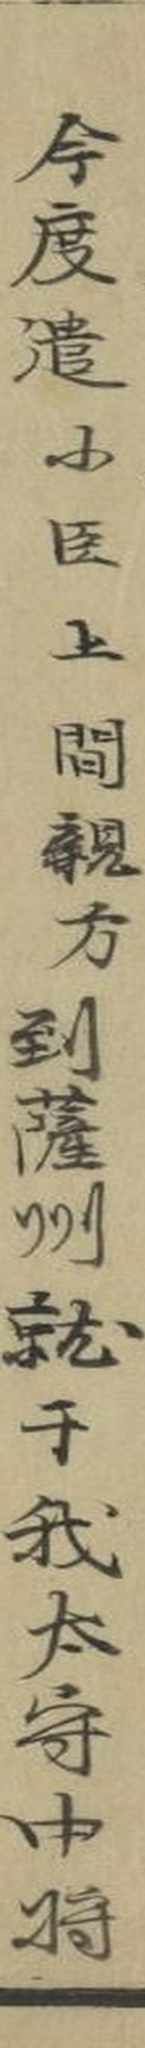今度遣小臣上間親方到薩州就于我太守中将
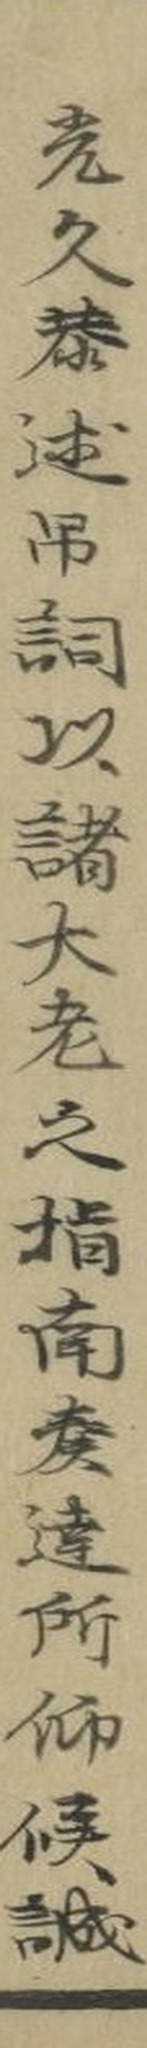光久恭述吊詞以緒大老之指南奏達所抑候誠
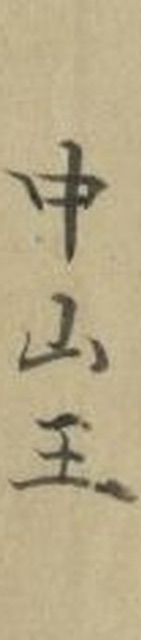中山王
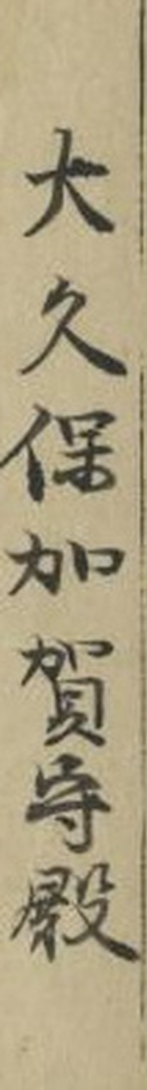大久保加賀守殿
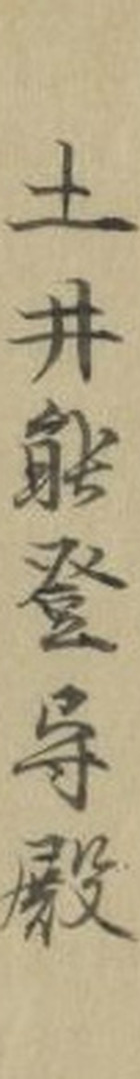土井能登守殿
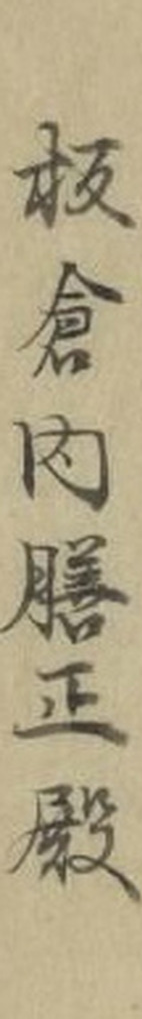板倉内膳正殿
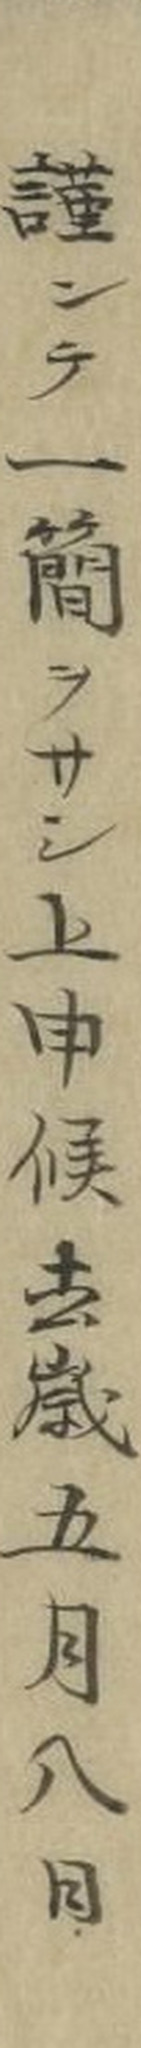謹ンテ一簡ヲサシ上申候去歳五月八日
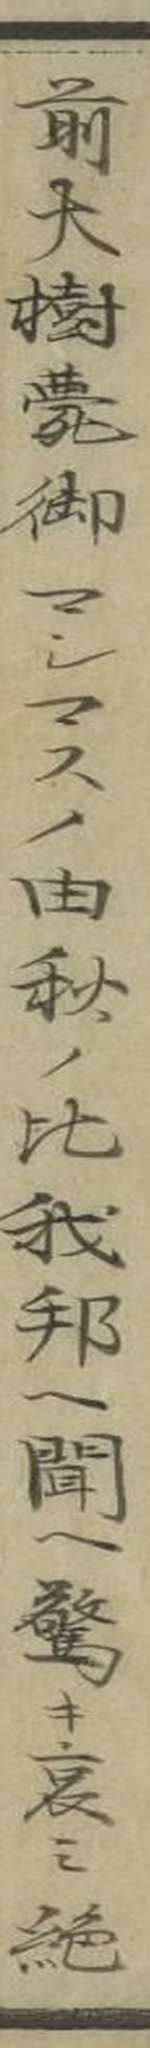前大樹薨御マシマスノ由秋ノ比我邦ヘ聞ヘ驚キ哀ミ絶
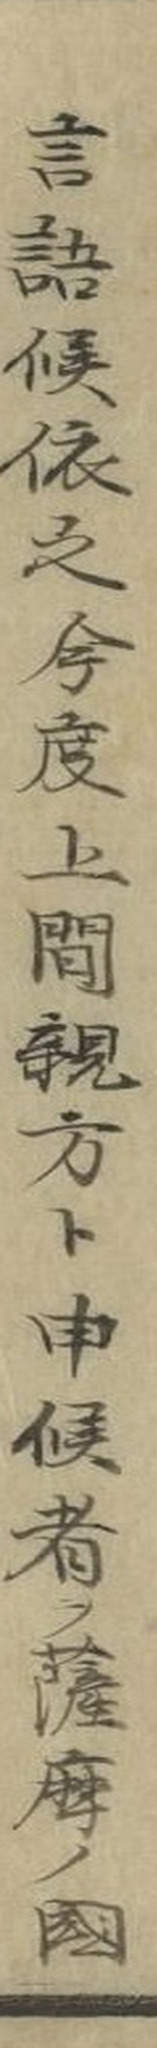言語候依之今度上間親方ト申候者ヲ薩摩ノ国
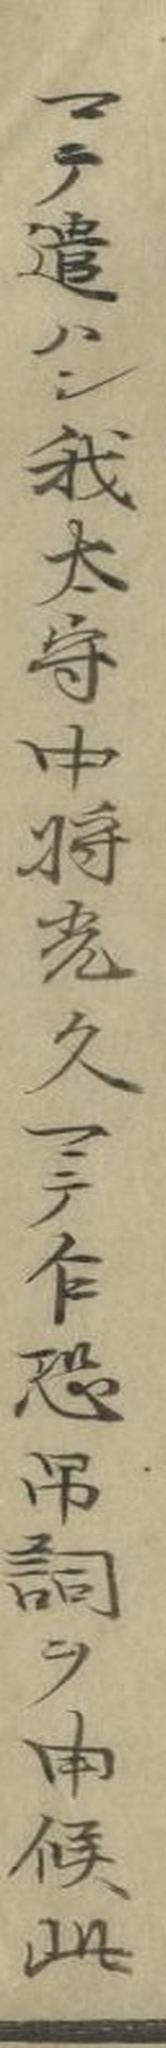マテ遣ハシ我太守中将充久マテ乍恐吊詞ヲ申候此
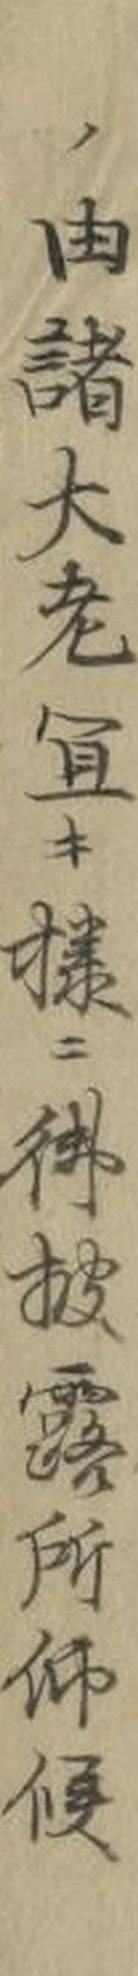ノ由諸大老宜キ様ニ御披露所抑候

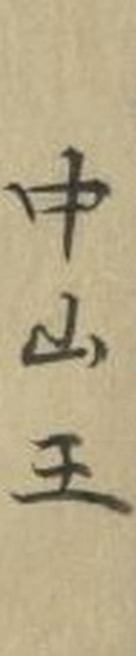中山王
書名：琉球往来（下）
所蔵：University of the Ryukyus Library
